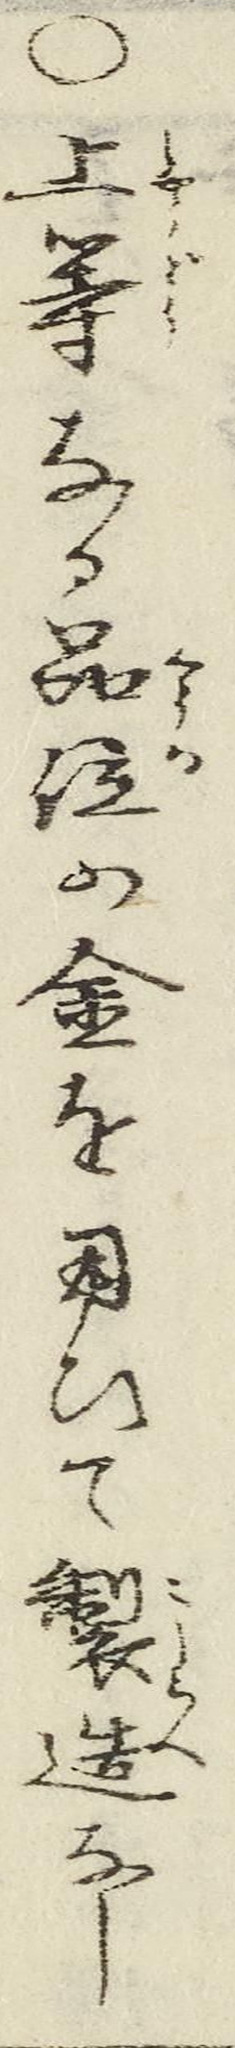○上等なる品位の金を用ひて製造なし
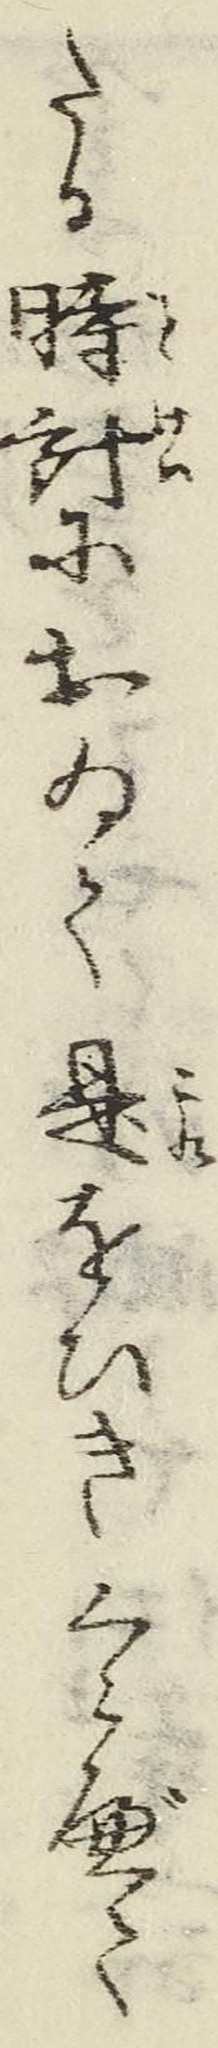たる時計におゐて是をひきくらへて
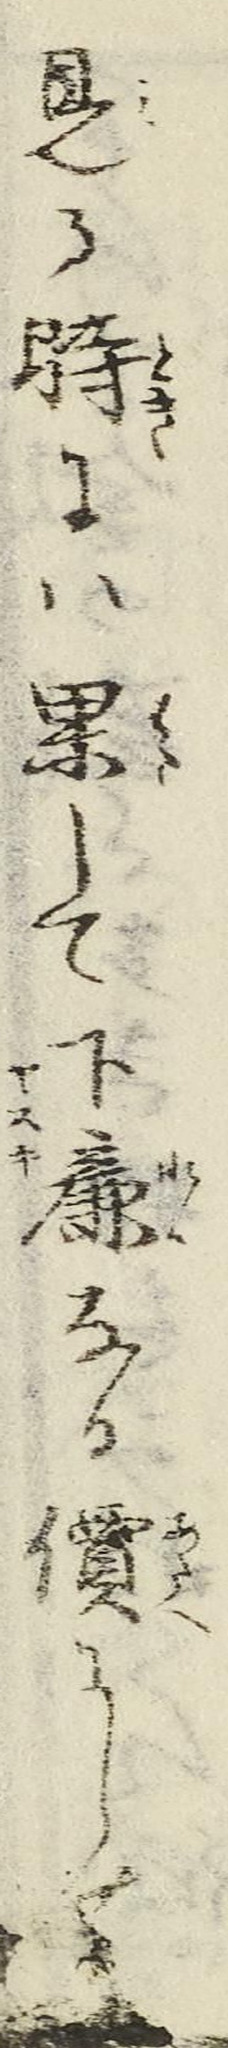見る時には果して下廉なる価にして
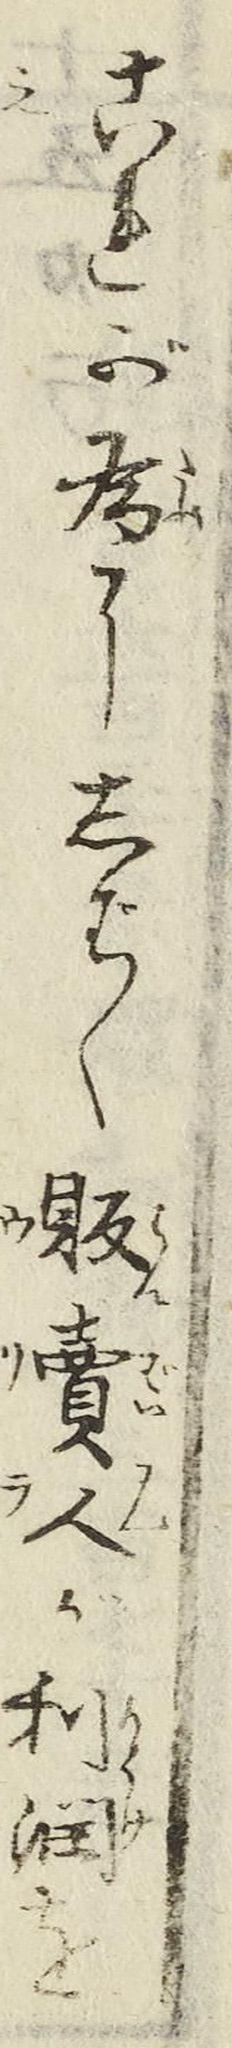これが為にしば〳〵販売人が利潤を
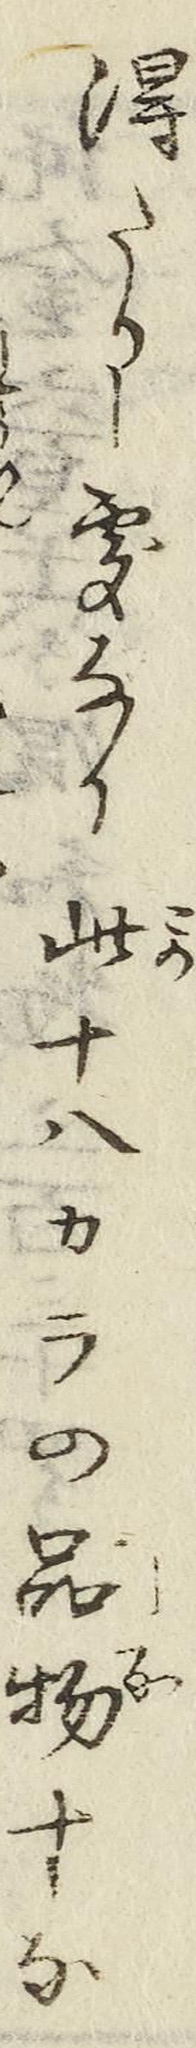得たりし処なり此十八カラの品物すな
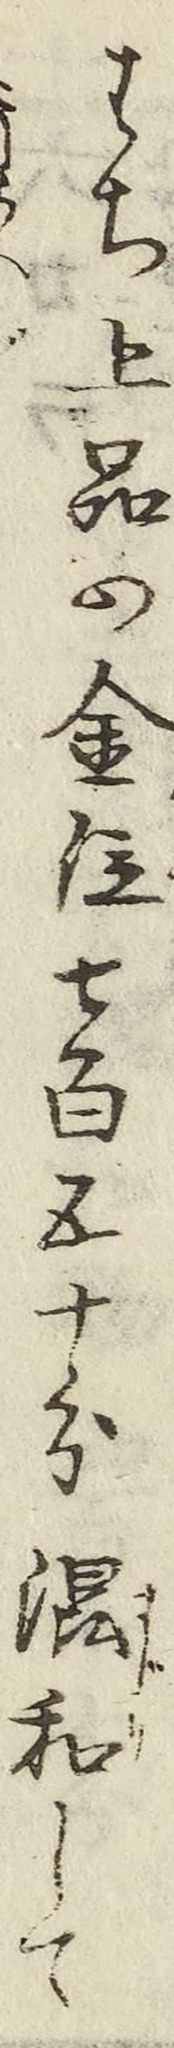はち上品の金位七百五十分混和して
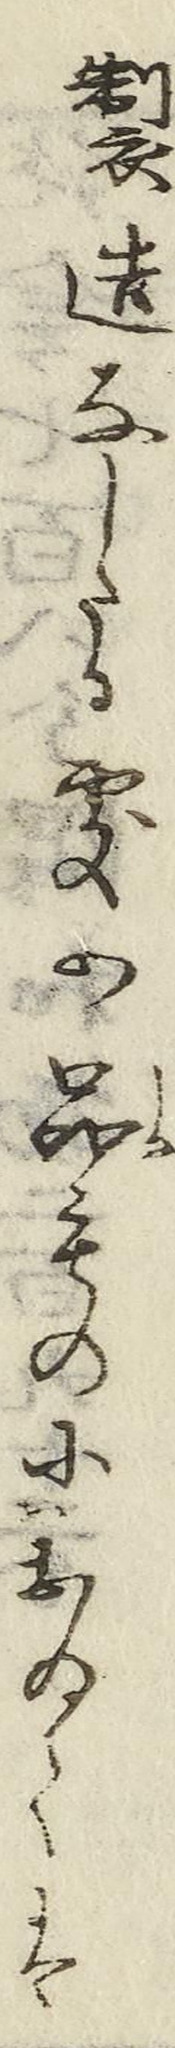製造なしたる処の品ものにおゐては
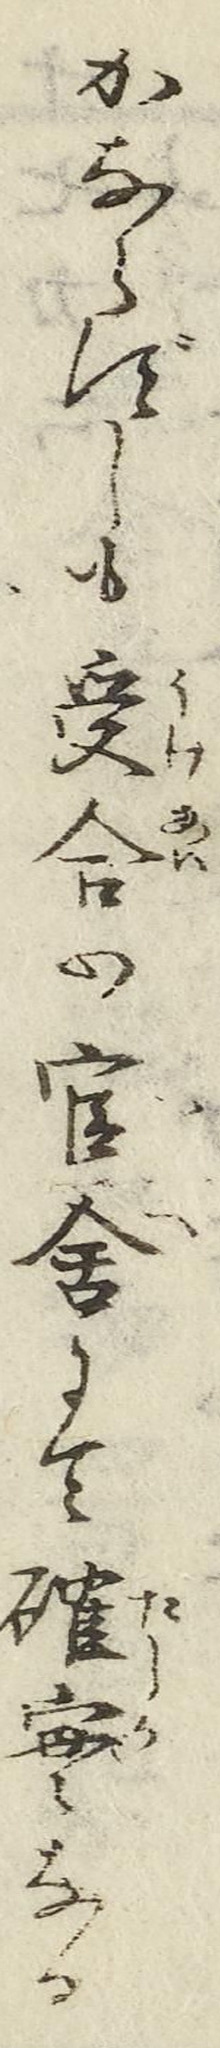かならずしも受合の官舎にて確実なる
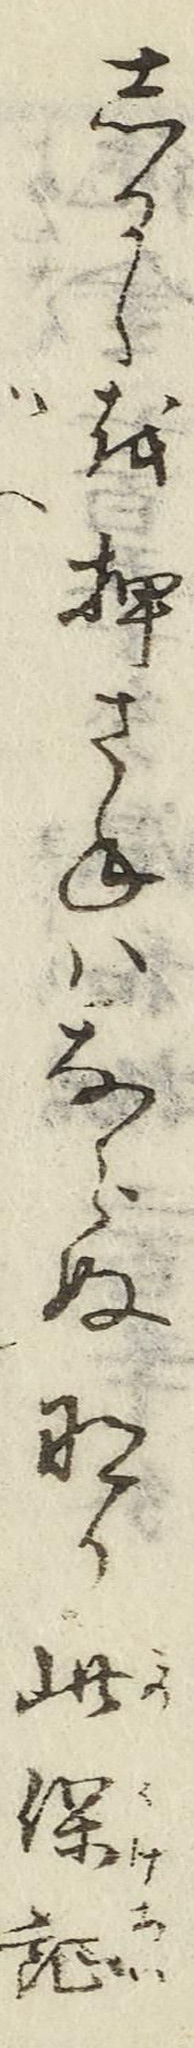しるしを押さねはならぬなり此保証
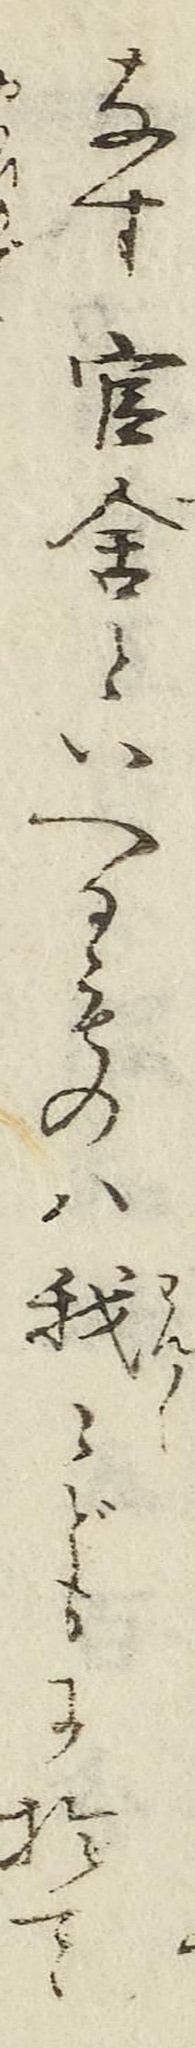なす官舎といへるものは我〻どちに於て
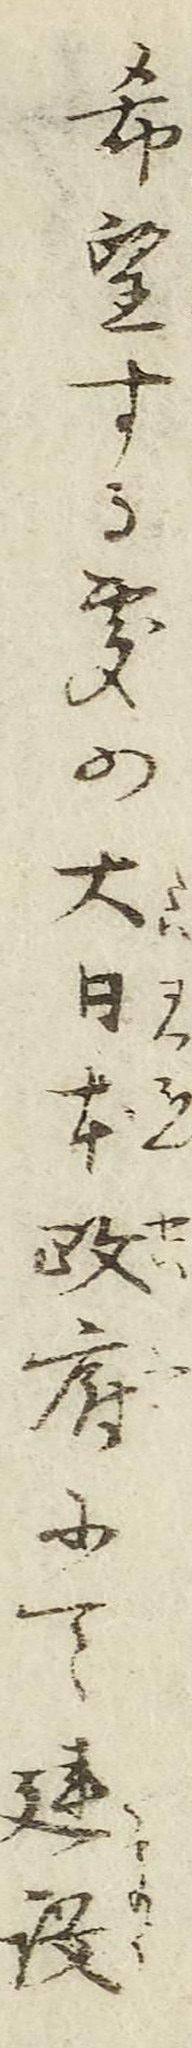希望する処の大日本政府にて建設
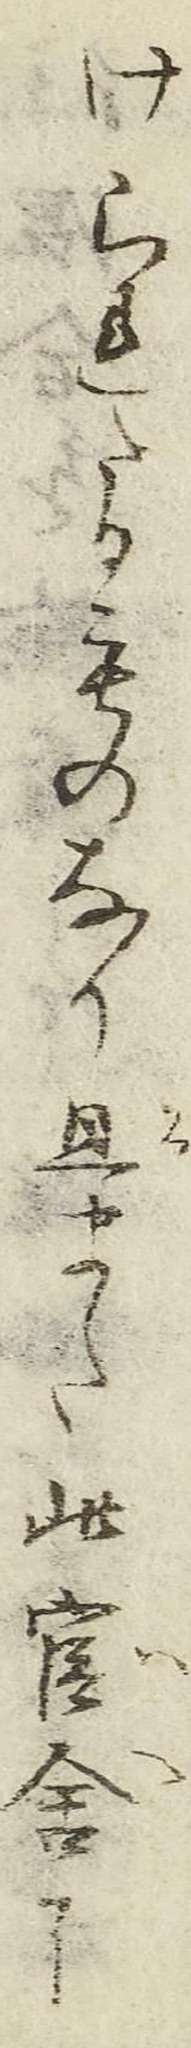けられたるものなり且また此官舎に
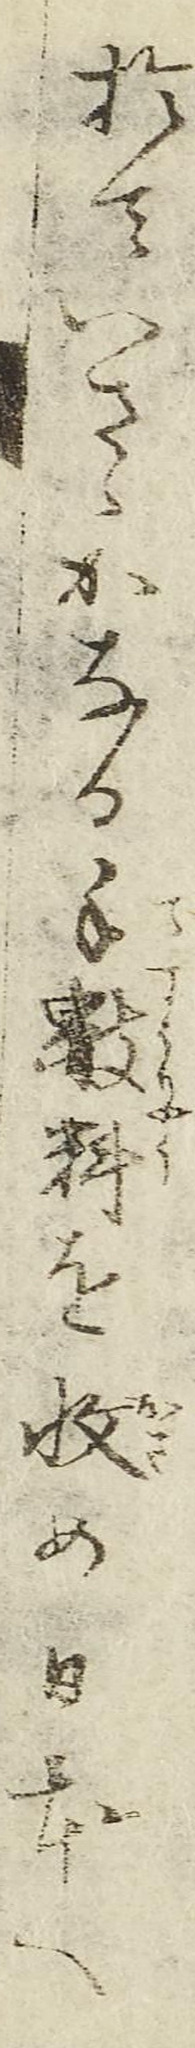於ていさゝかなる手数料を収め日本へ

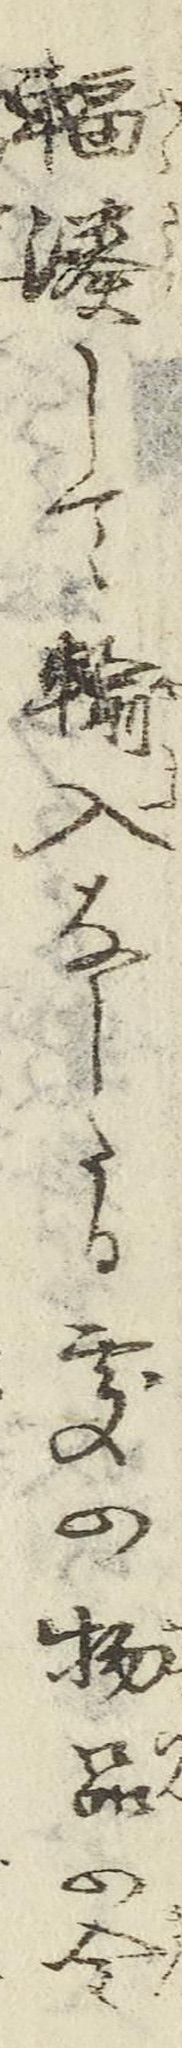輻湊して輸入なしたる処の物品の金
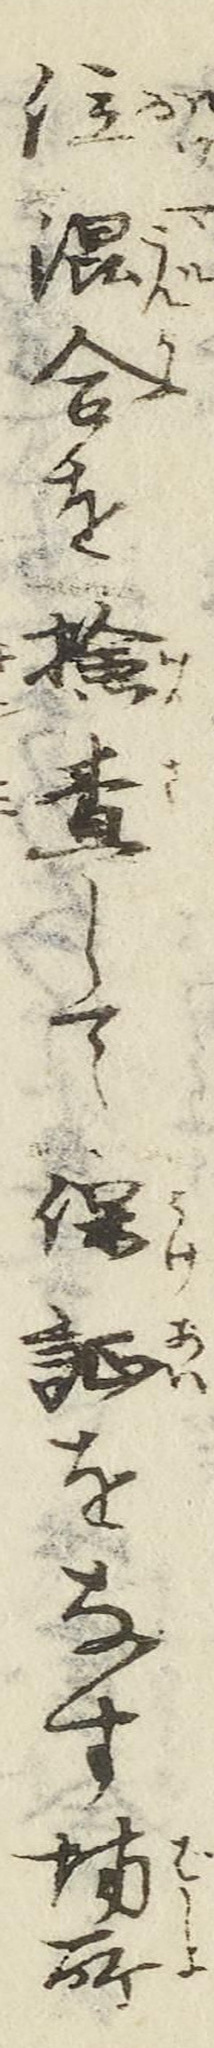位混合を検査して保証をなす場所
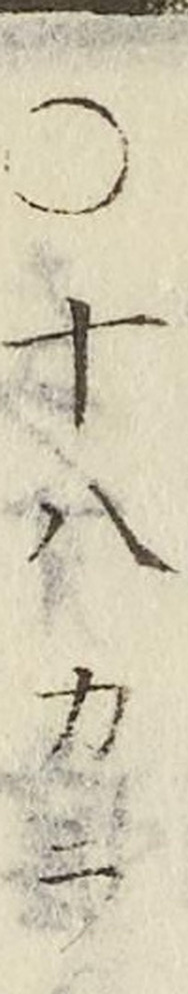○十八カラ
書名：[時計に関する冊子]
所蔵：東京大学地震研究所図書室 Earthquake Research Institute Library, The University of Tokyo, JAPAN
